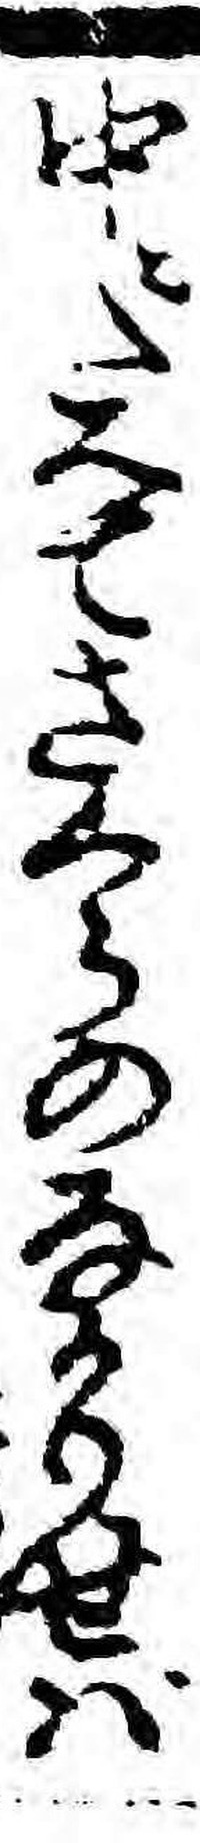中にたへてさくらのなかりせは
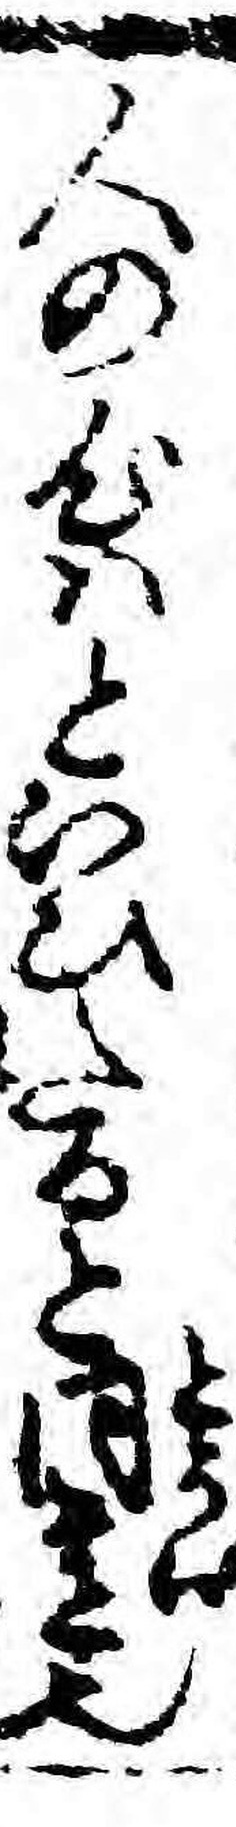人の心はといひたると同意也
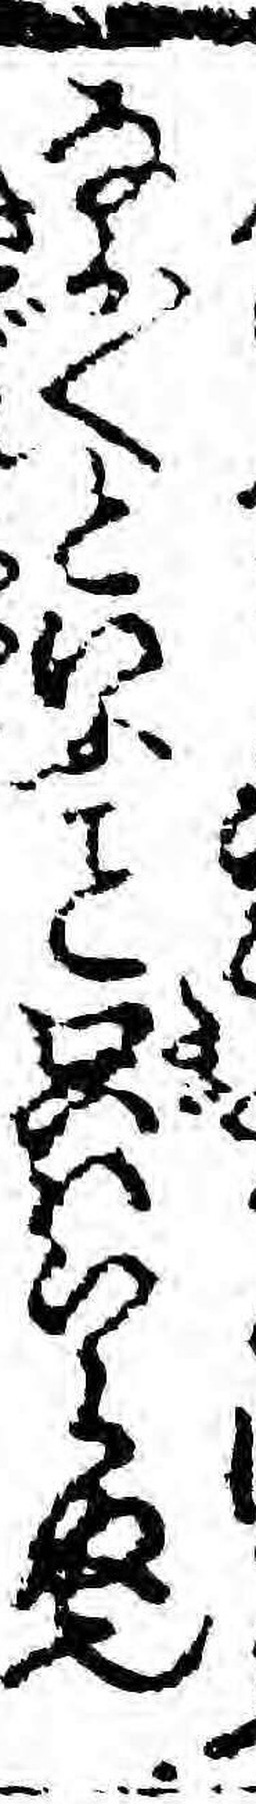なか〳〵といふを只はいらぬ也
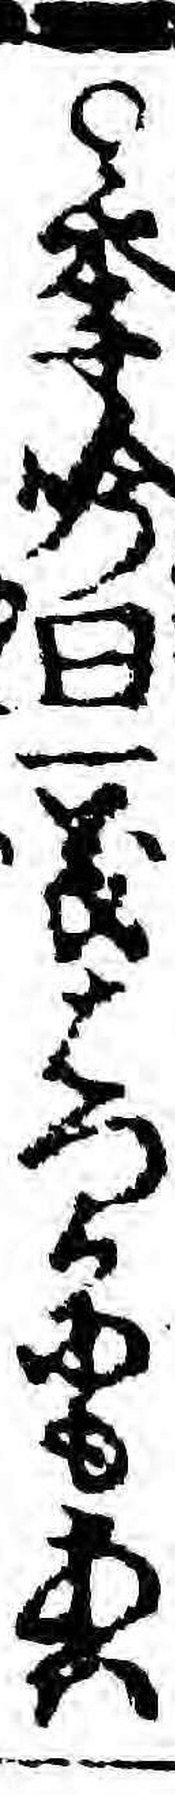〇季吟曰一義はつかにもあは
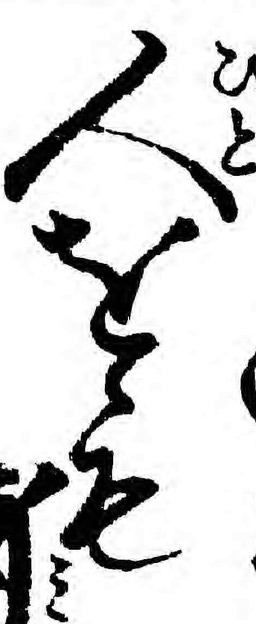人をも
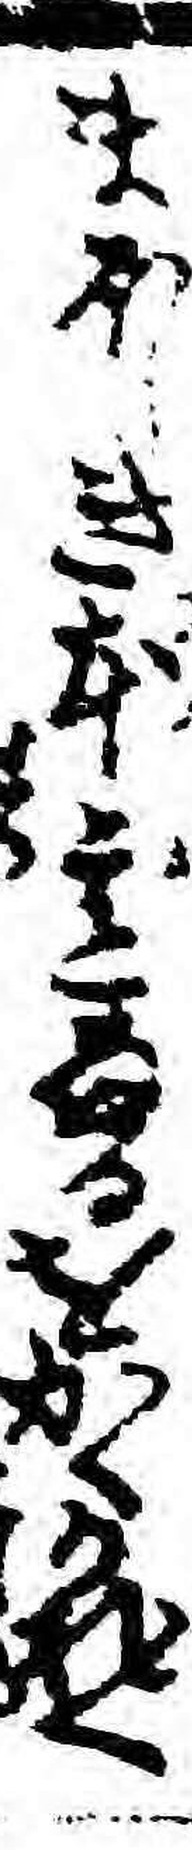ましき本位なるをかくかれ〳〵
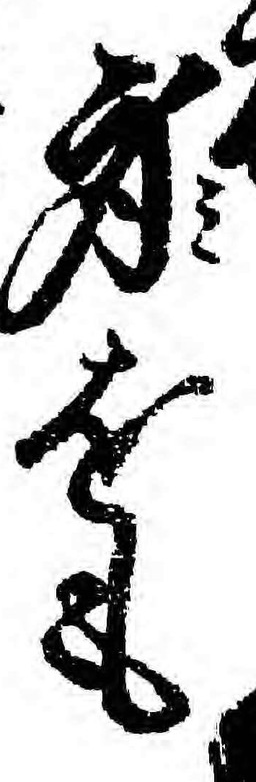身をも
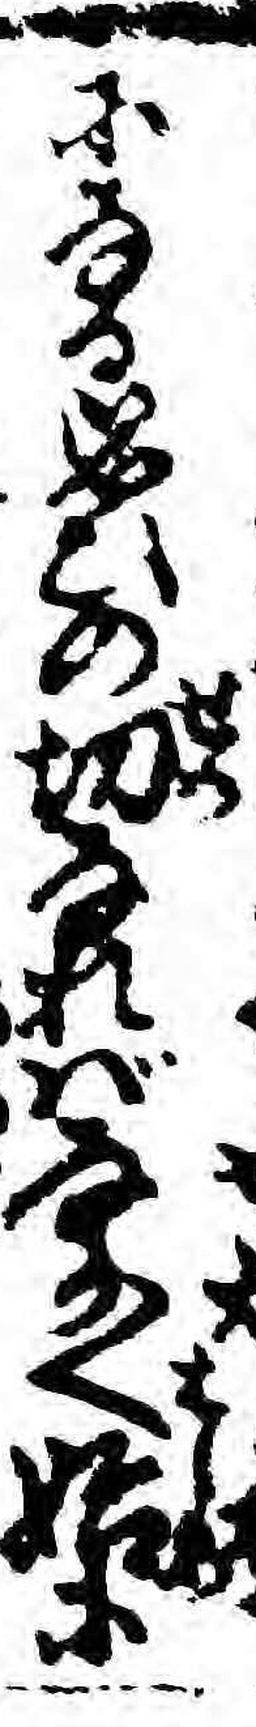になる思ひの切なればなか〳〵始に
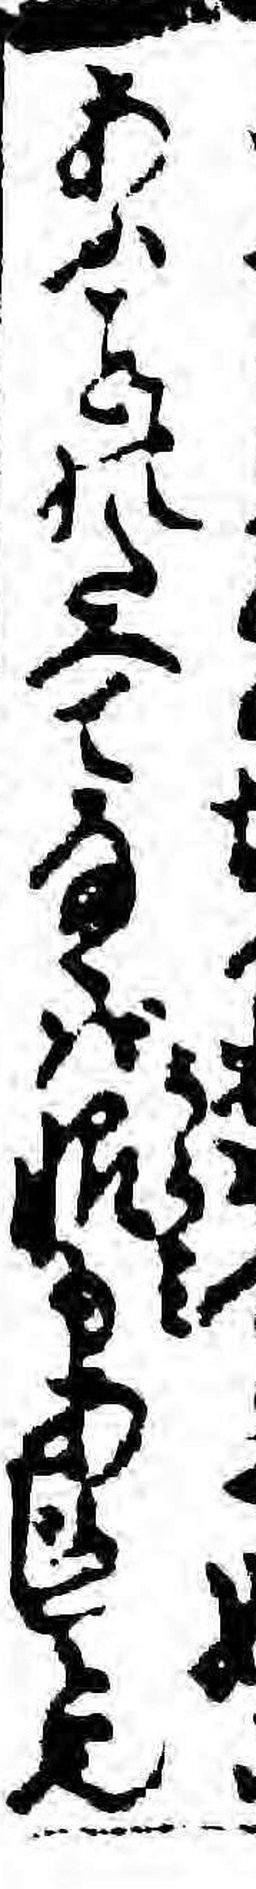あふことのたへてなくば恨もあらじと也
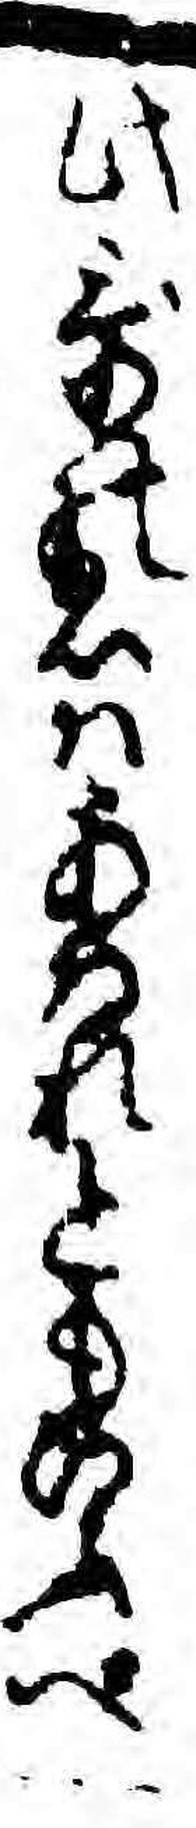此哥の心はあはれともいふべ
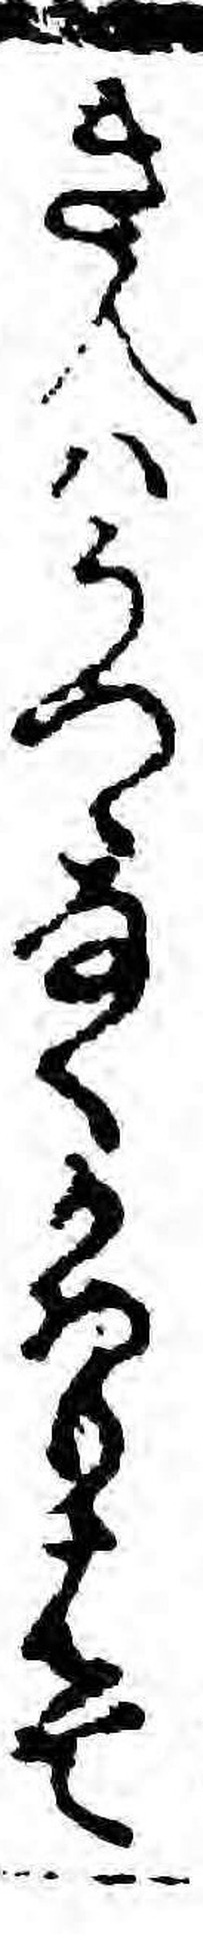き人はうつゝなくかはりはて
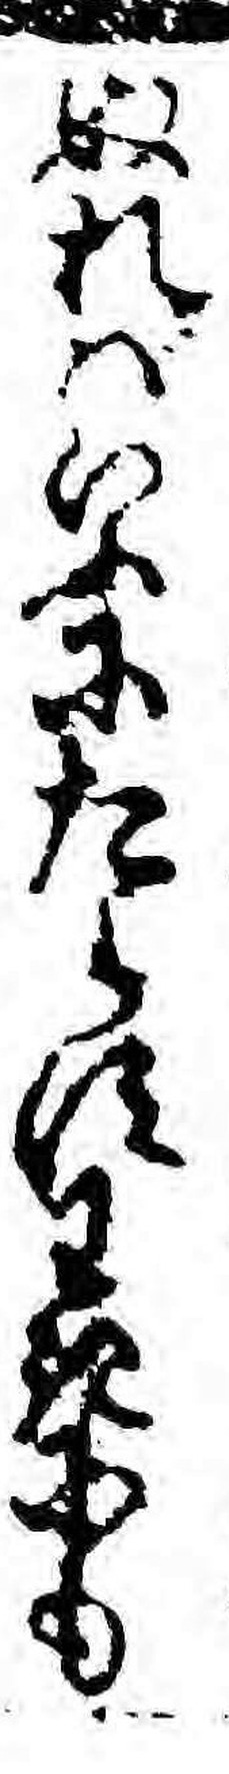ぬればいふにたらすわきにも
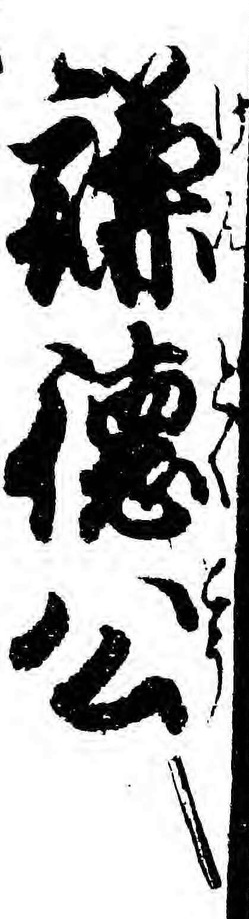謙徳公
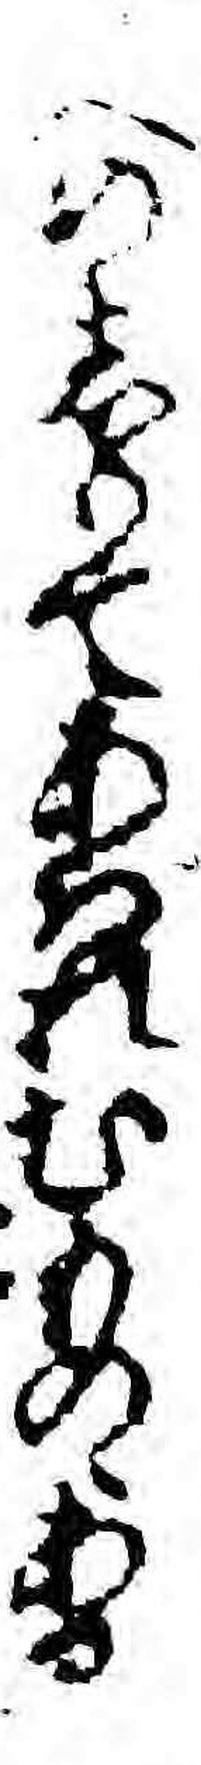人の知りてあはれむものゝある
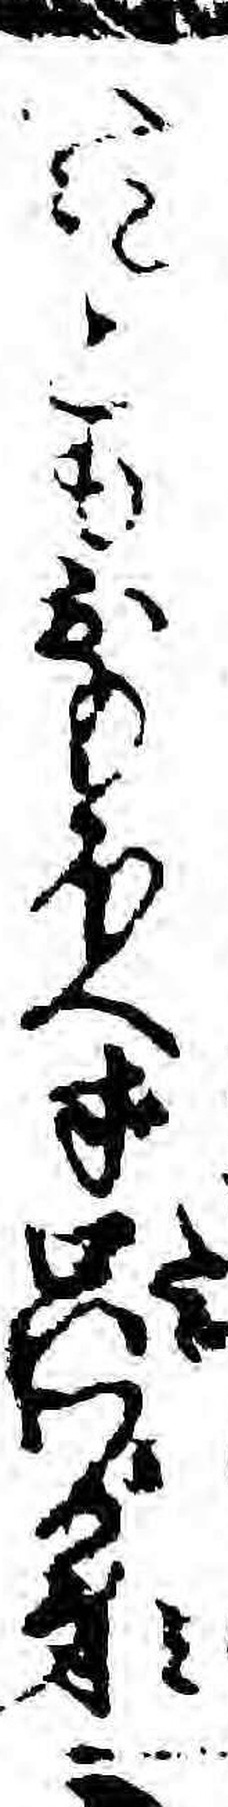べきともおもほへず只わが身
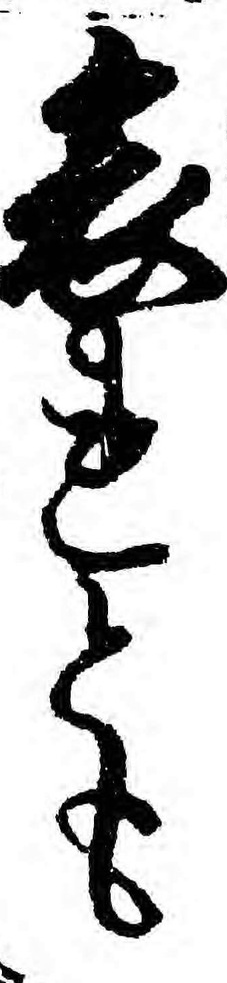哀れとも
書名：頭書和歌注譯／壽賀多百人一首小倉錦
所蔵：国文学研究資料館
